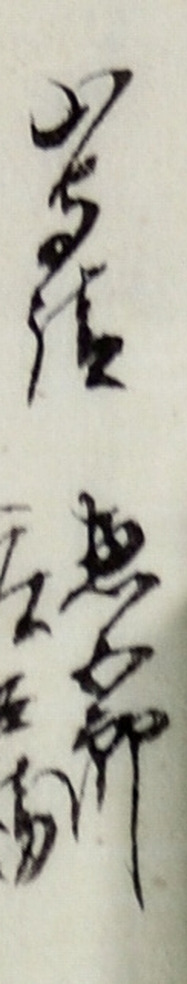山守請惣五郎
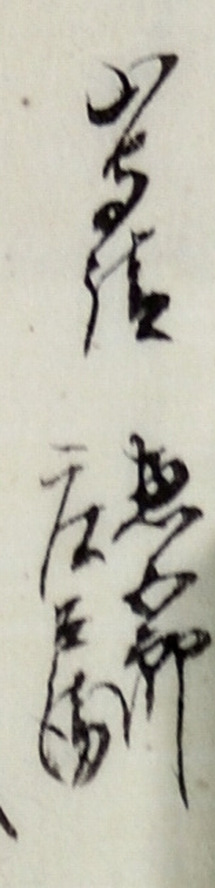山守請惣五郎
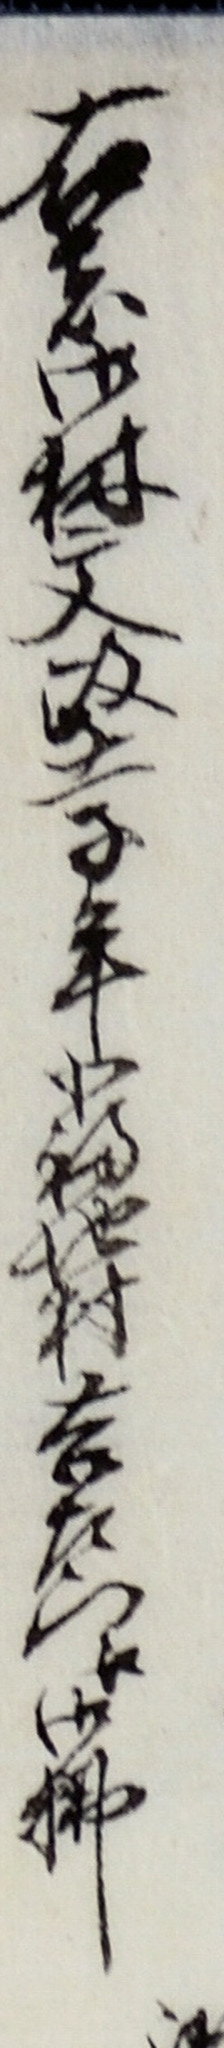右は御林文政十一子年北福池村吉左衛門え御払
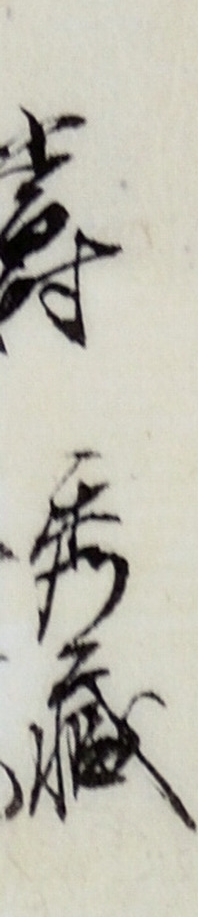当時秀蔵
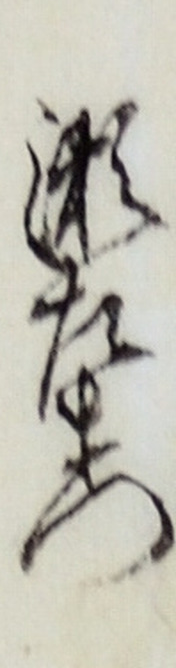瀬左衛門
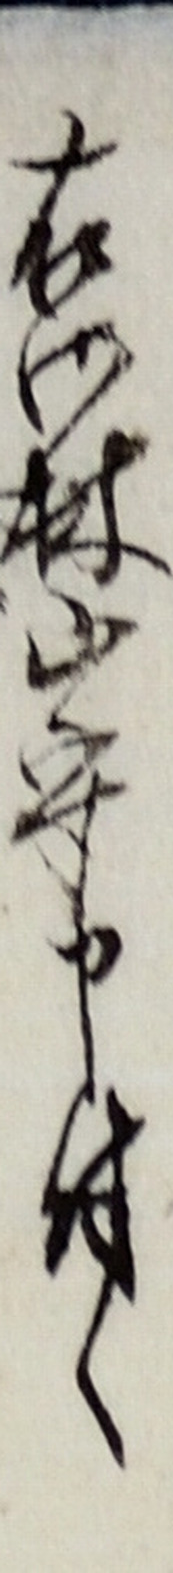右御林山守申付候
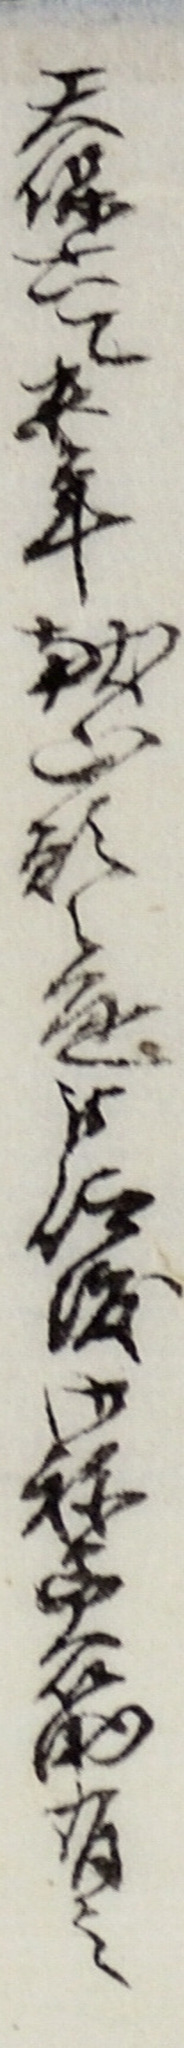天保六乙未年献山願之通被仰渡御称美筋有之
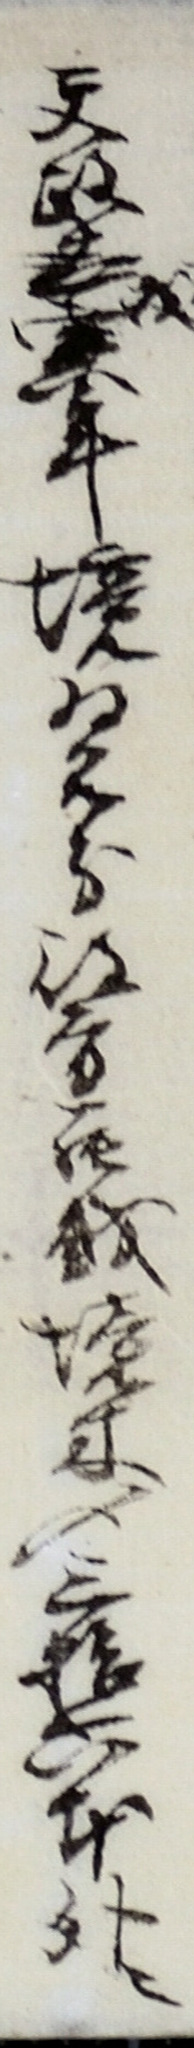文政壱戊寅年境為見分役方罷越境木〆三拾六本外ニ
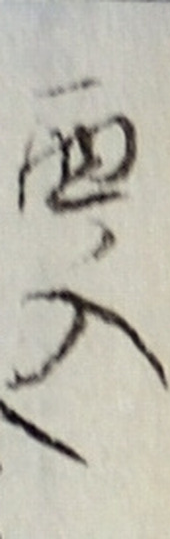西ノ入
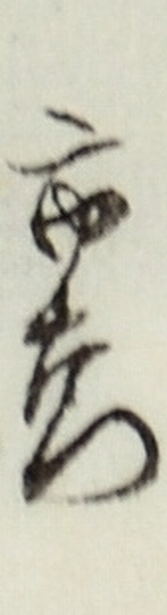利右衛門
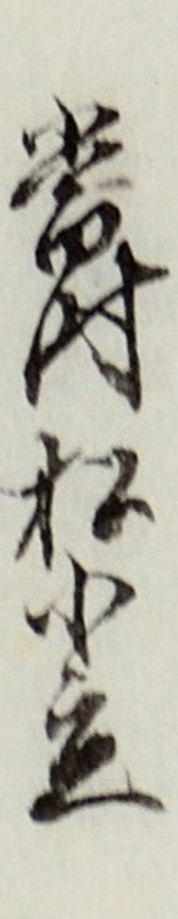当村松小立
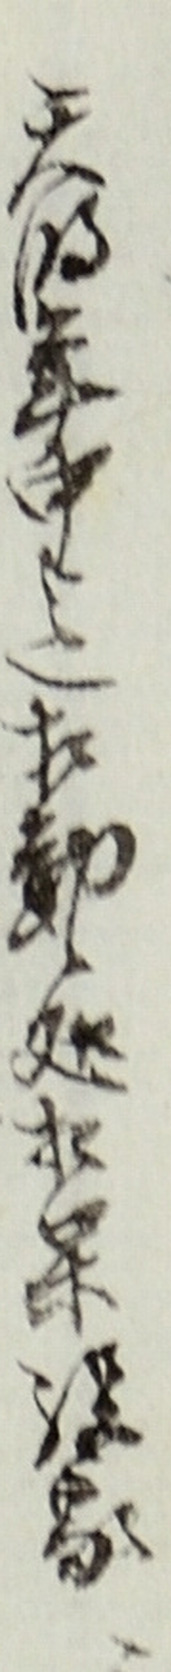天明年中迄相勤候処相果絶家
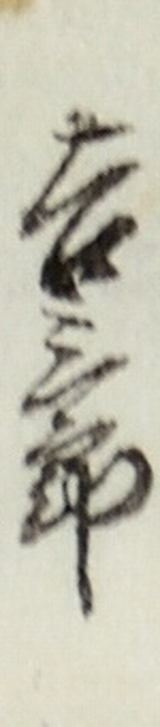吉三郎
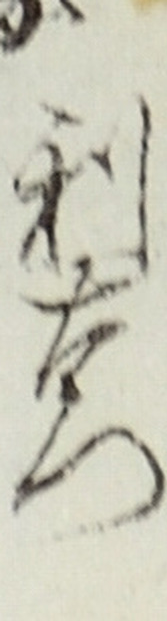利右衛門
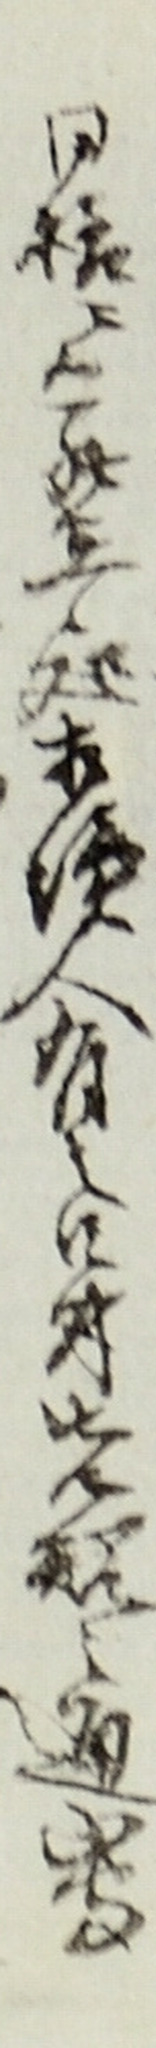同様ニ而罷在候処相続人有之候付先規之通山守
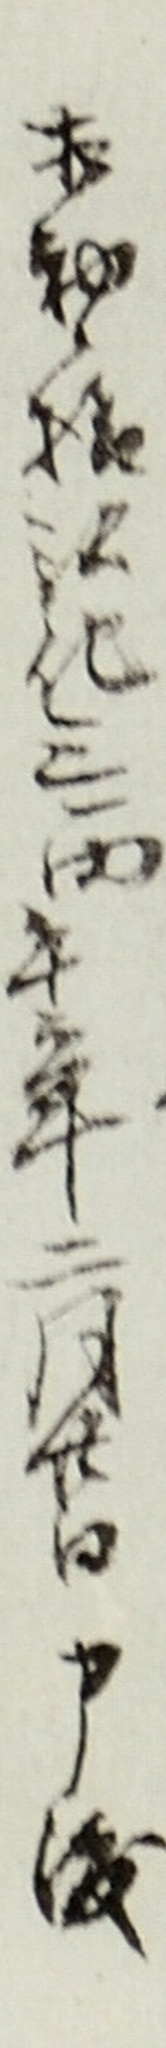相勤候様弘化三丙午年二月廿日申渡
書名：山林帳草稿
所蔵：伊那市立高遠町図書館・合同会社AMANE
